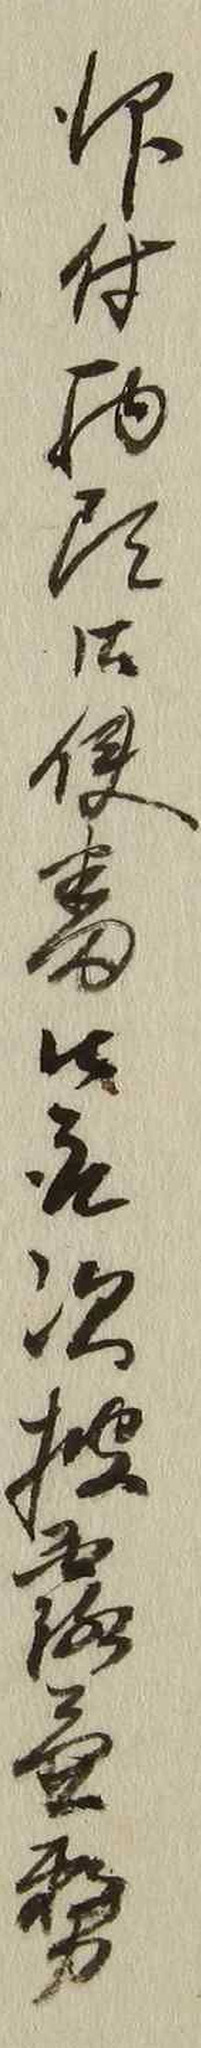仰付物頭御使番御取次披露兼務
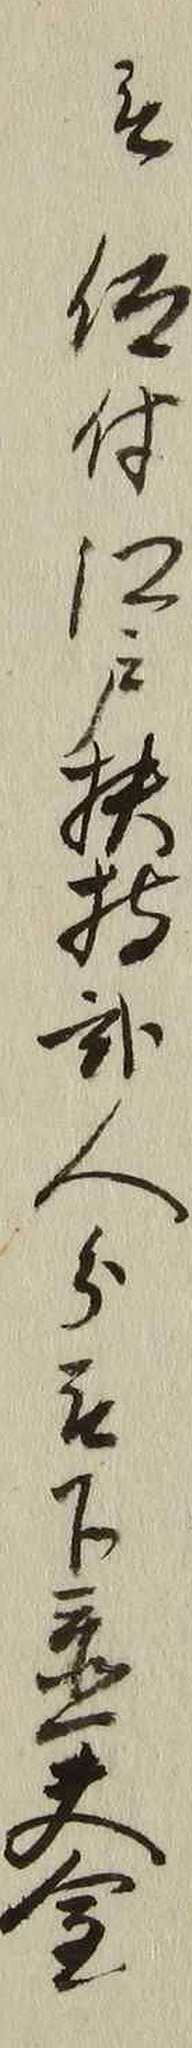被仰付江戸扶持弐人分被下置夫金
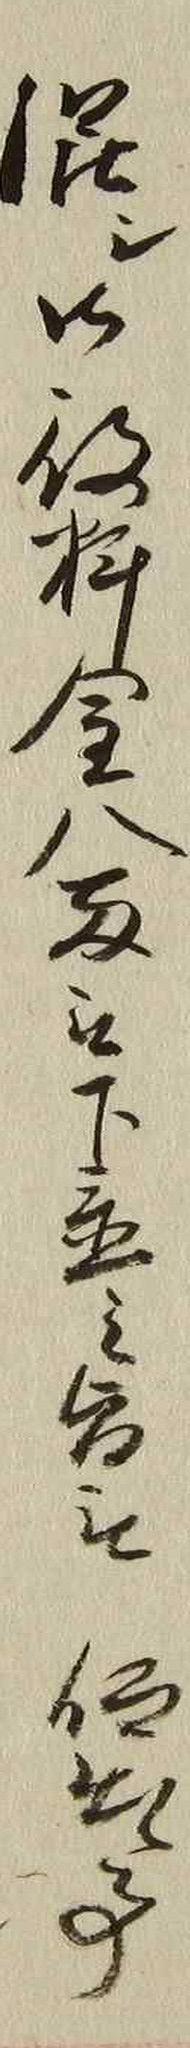混シ御役料金八両被下置之旨被仰出候事
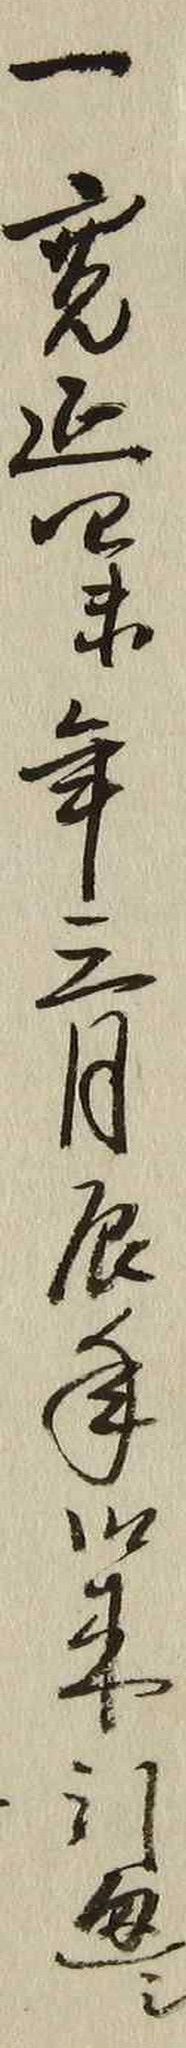一寛延四未年三月辰年御来引通シ
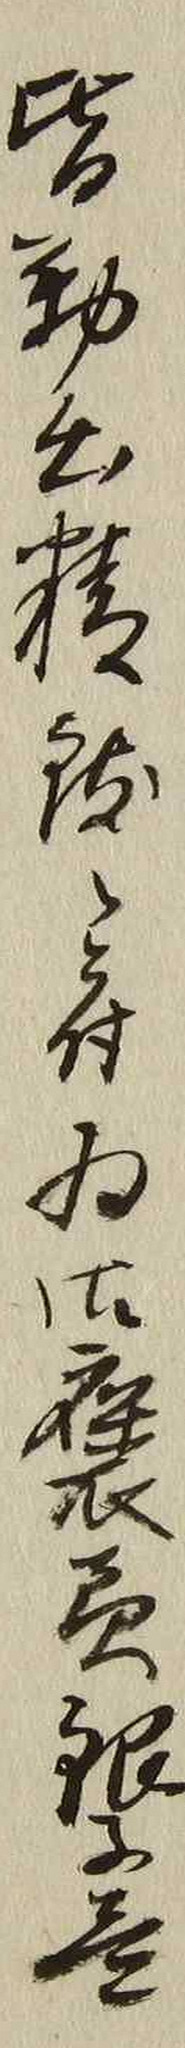皆勤出精致候ニ付為御褒美銀子壱
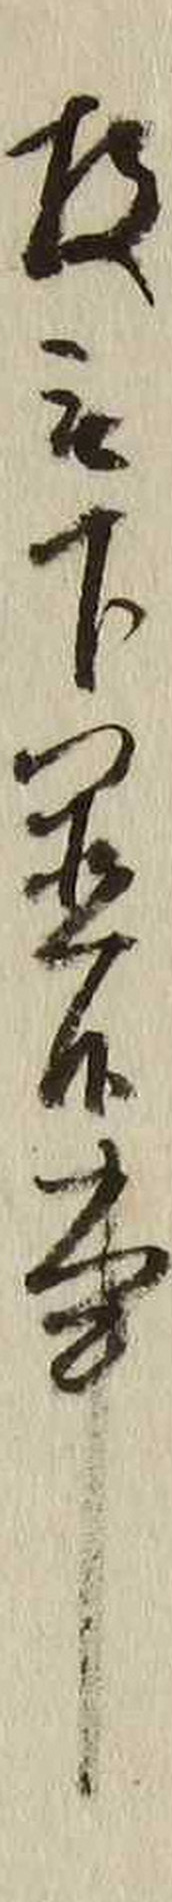枚被下置候事
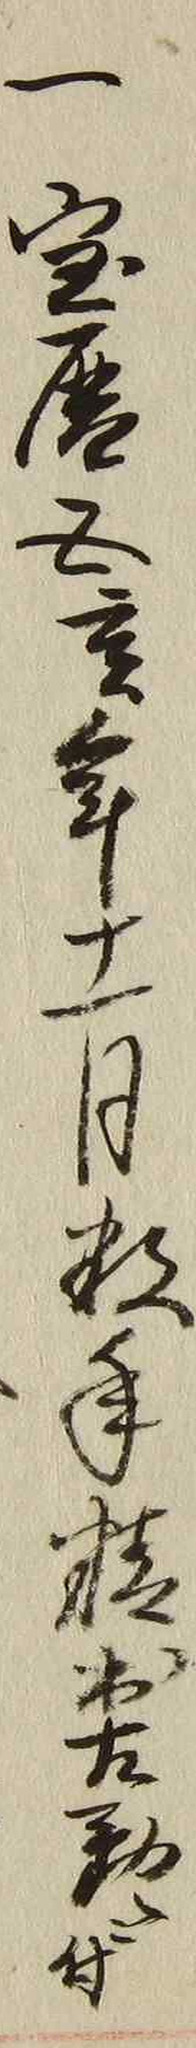一宝暦五亥年十一月数年精出相勤候ニ付
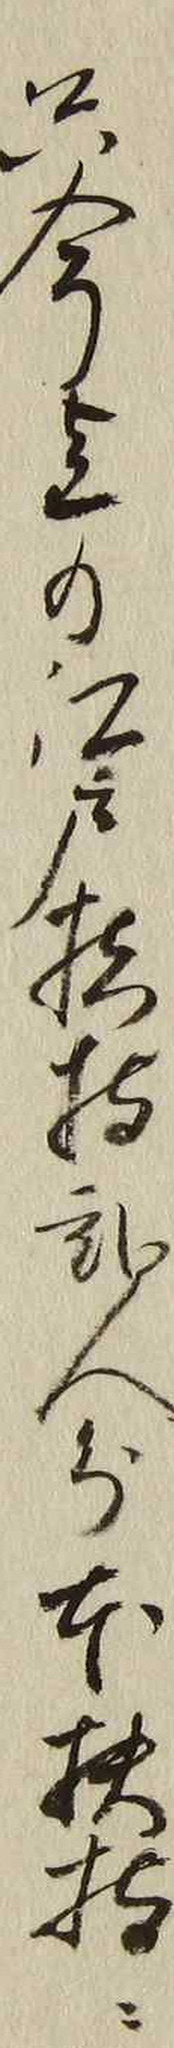只今迄の江戸扶持弐人分本扶持ニ
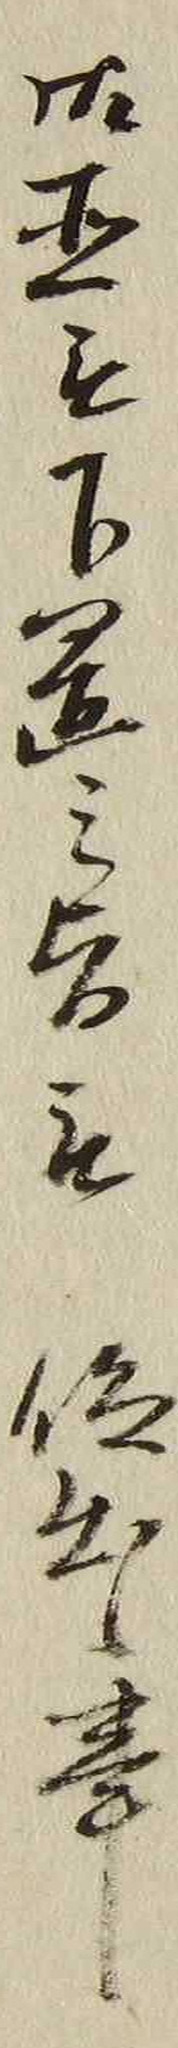御直被下置之旨被仰出候事
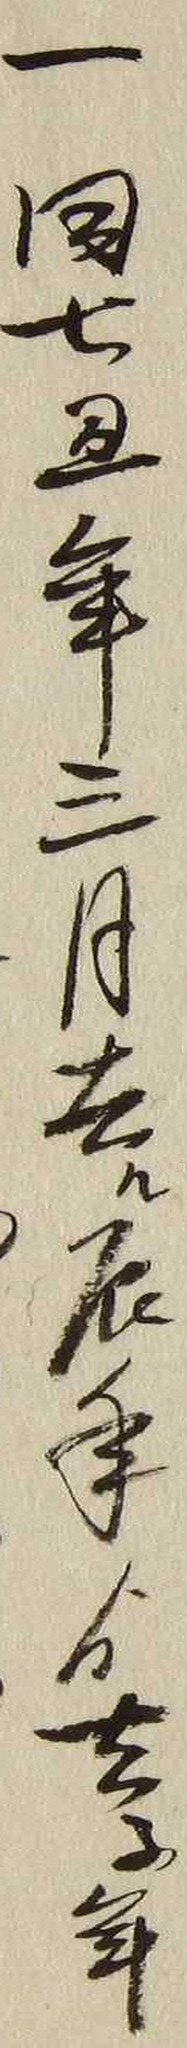一同七丑年三月去ル辰年ゟ去子年
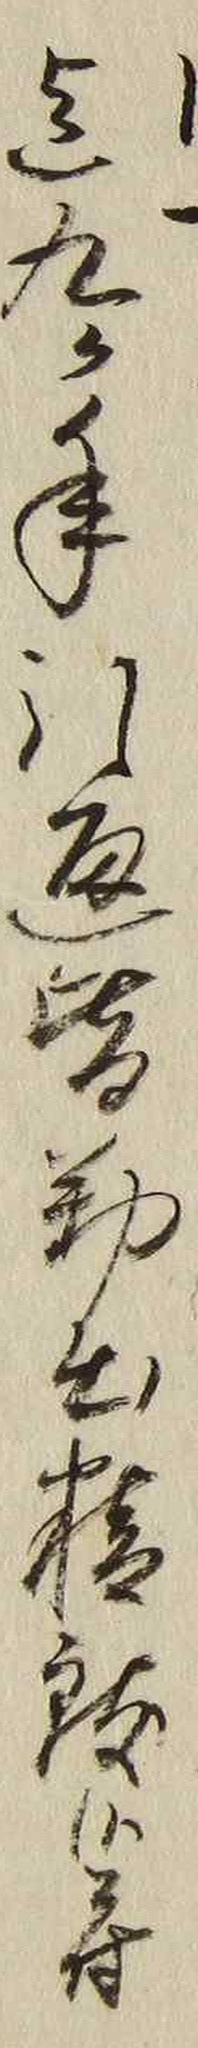迄九ケ年引通皆勤出精致候ニ付
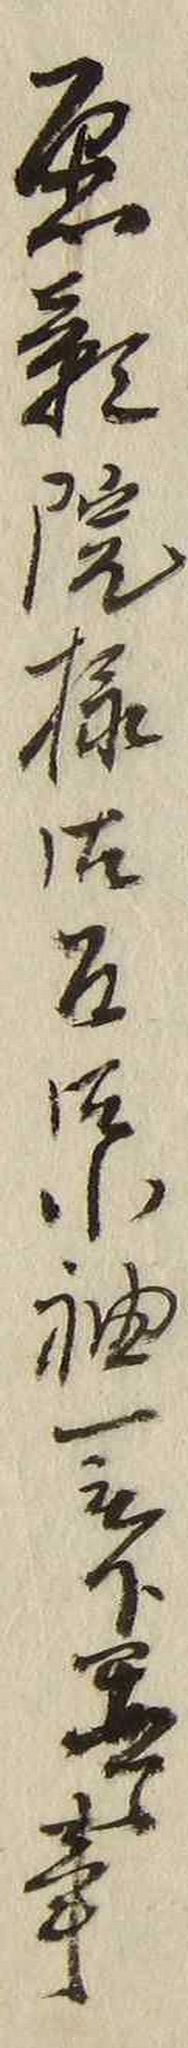愿彰院様御召御小袖一被下置候事

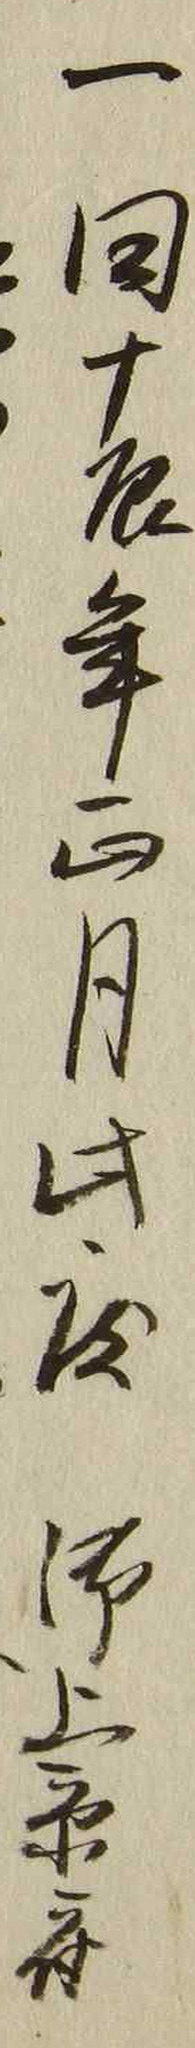一同十辰年正月此度御上京ニ付
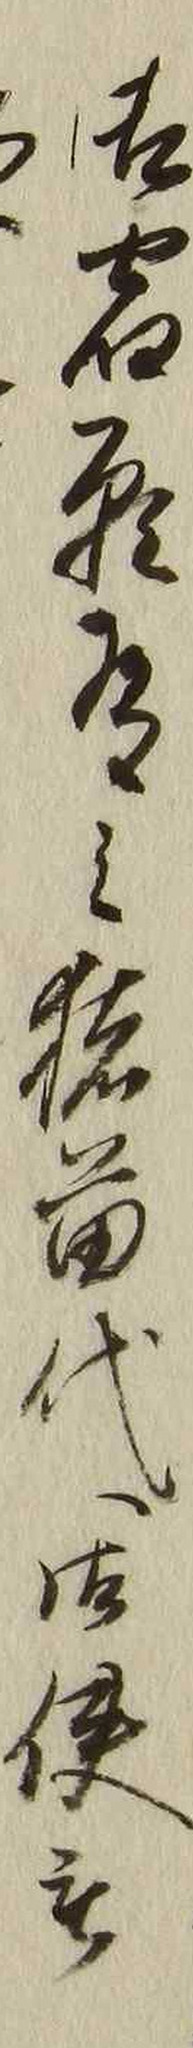宿願有之猪苗代へ御使被
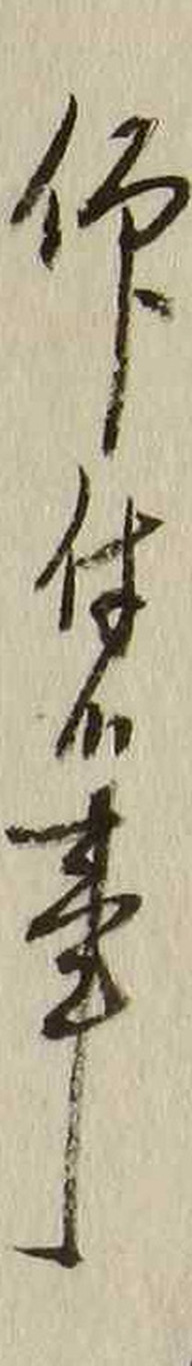仰付候事
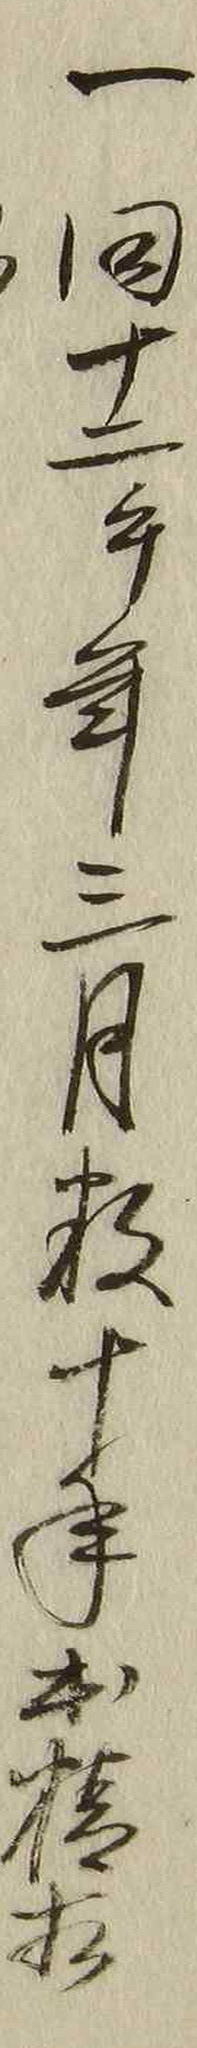一同十二午年三月数十年出精相
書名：諸士系譜　巻之349　も之部5
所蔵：会津若松市立会津図書館
